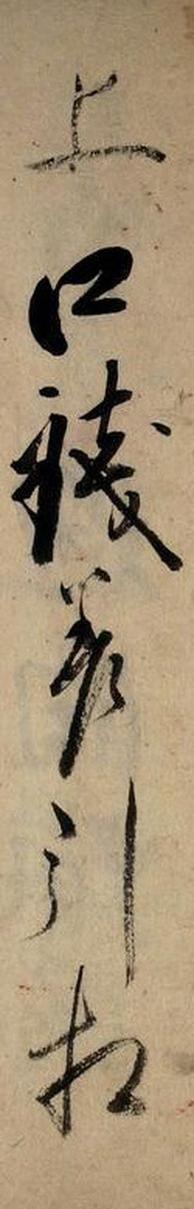上口銭差引相
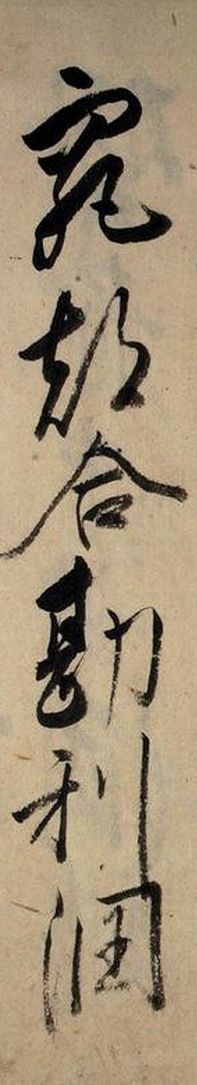究都合勘利潤

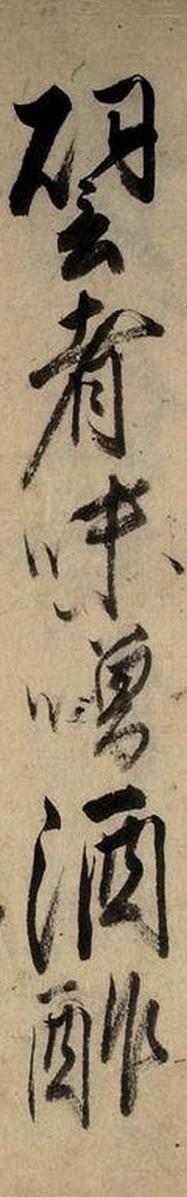譬者味噌酒酢
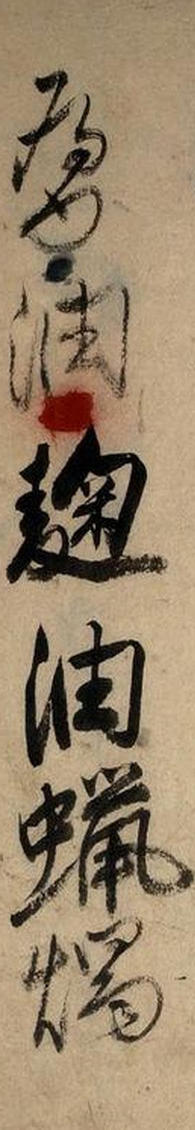醤油麹油蝋燭
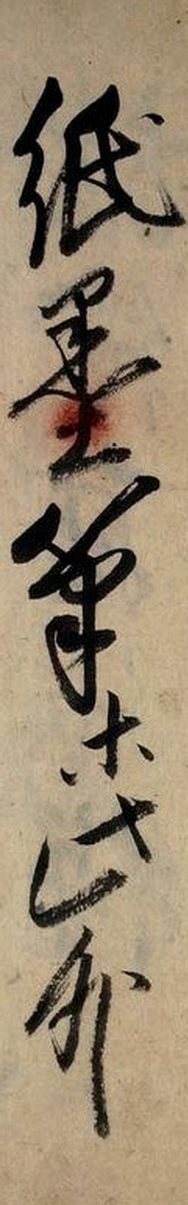紙墨筆等此外
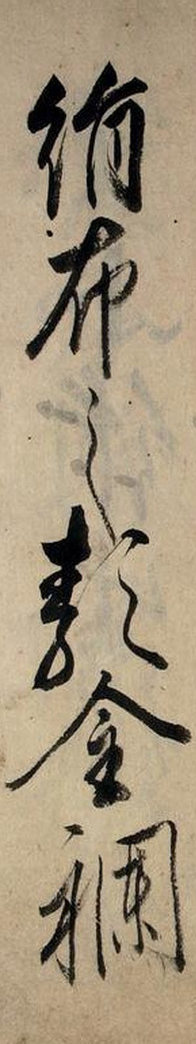絹布之類金襴
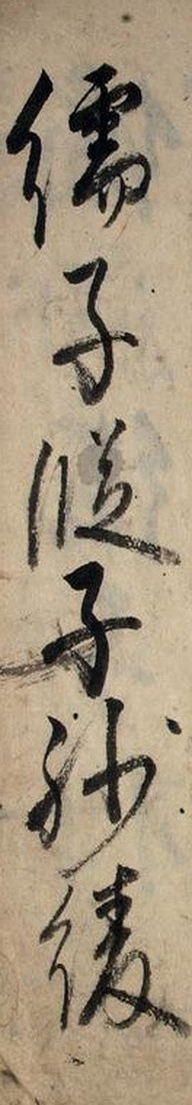繻子段子紗綾

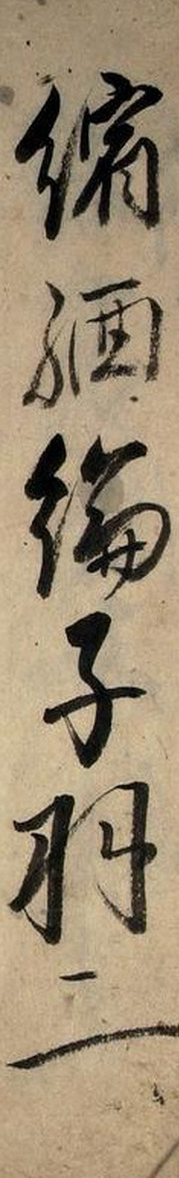縮緬綸子羽二
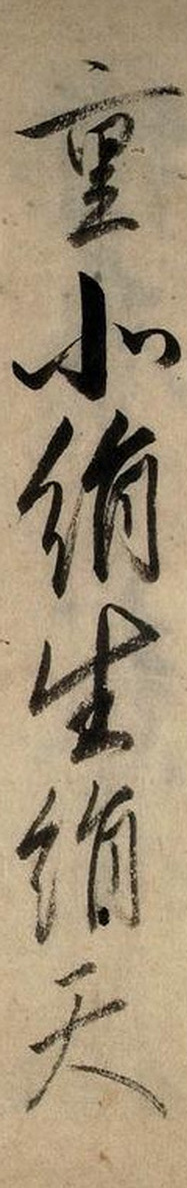重北絹生絹天
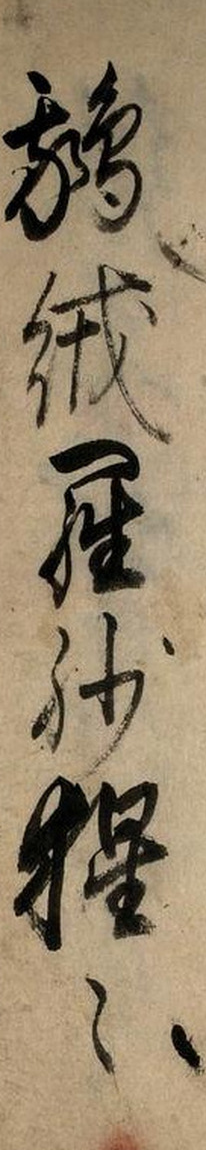鵝絨羅紗猩々
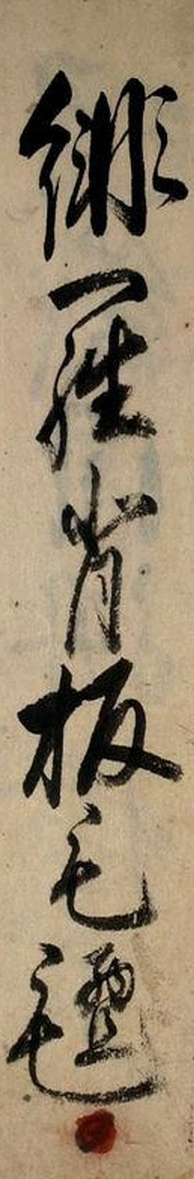緋羅背板毛氈
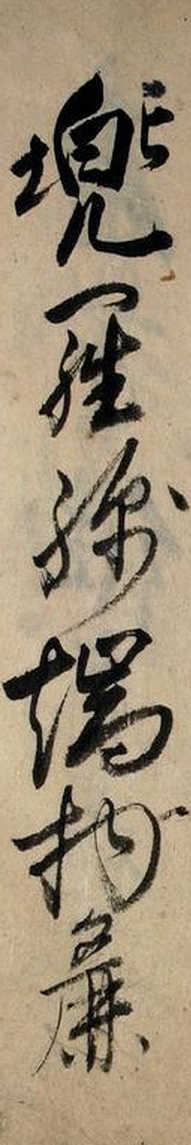兠羅綿端物鹿
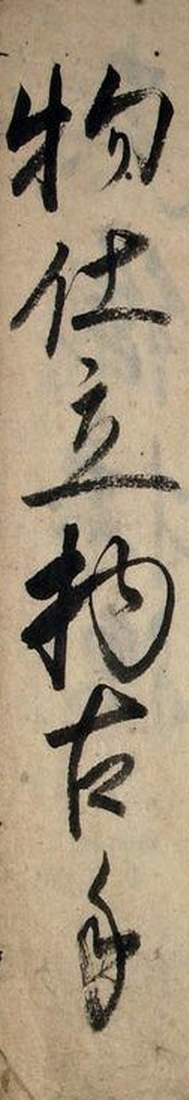物仕立物右手

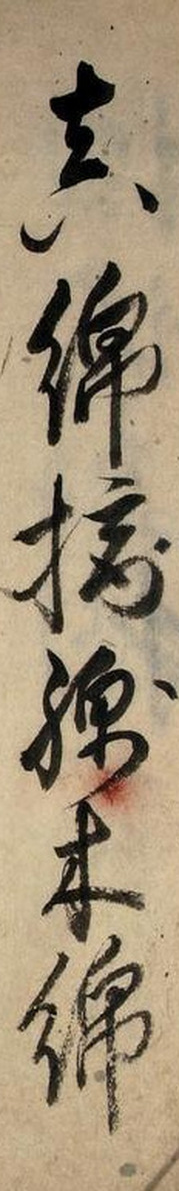真綿摘綿木綿
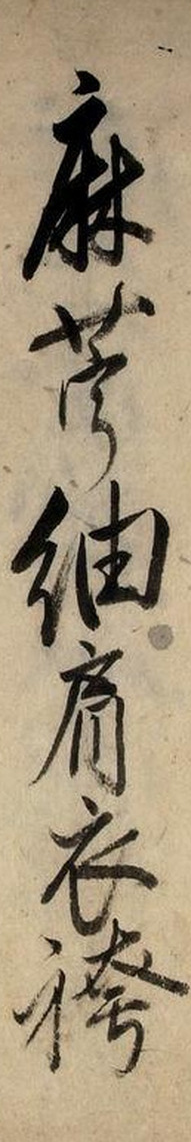麻苧紬肩衣袴
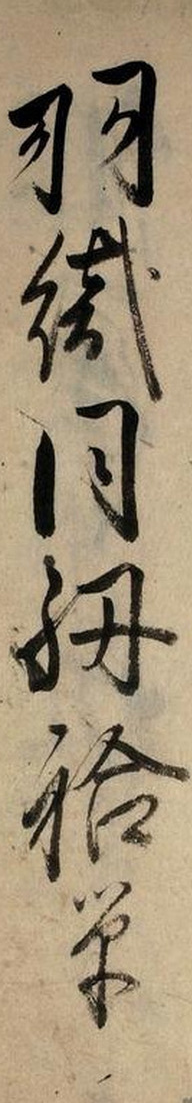羽織同紐袷単
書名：商売往来（往来物、手習手本）
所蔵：福井県文書館 Fukui Prefectural Archives
